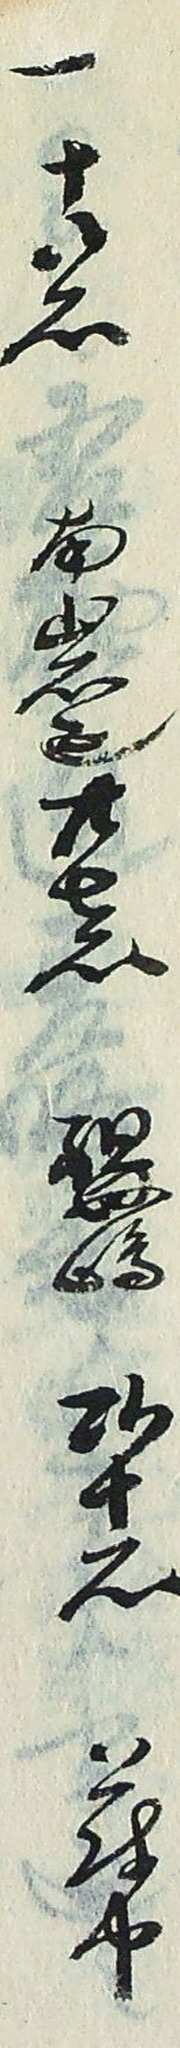一十八石南岩延廿七石祖母嶋弐十石符中
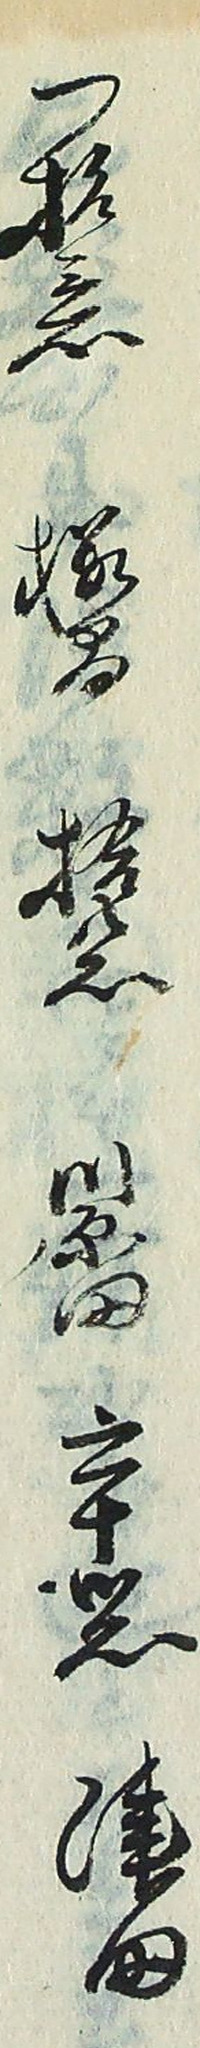一拾三石桜間拾八石川原田六十弐石津田
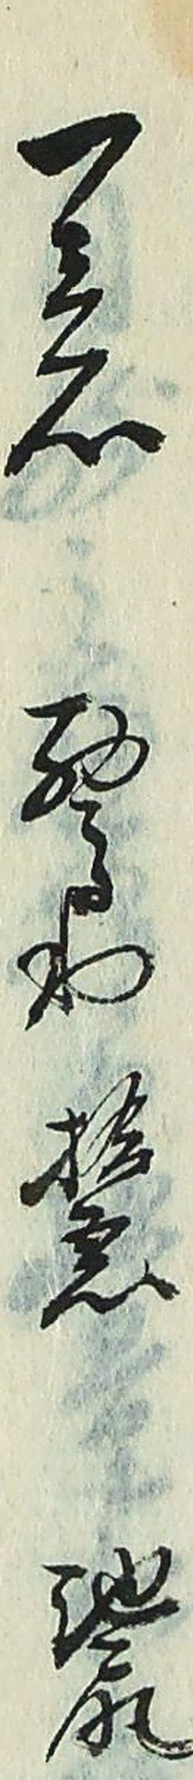一三石西高輪拾五石池尻
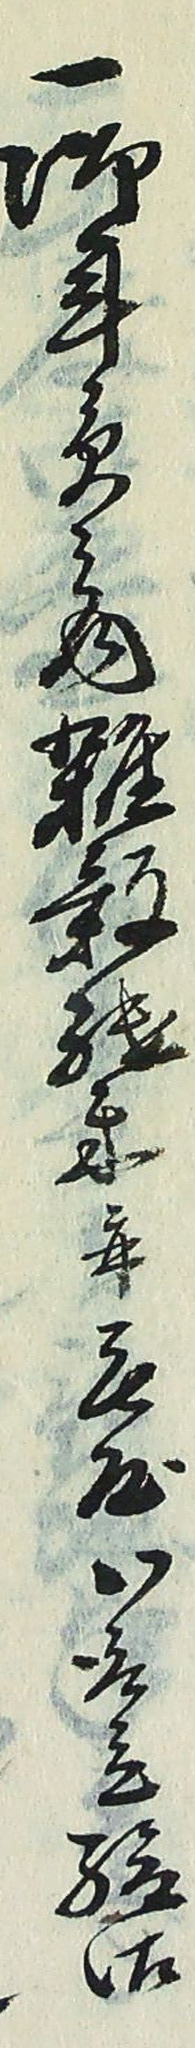一御年貢之内雑穀継米幷庄屋御取立給御
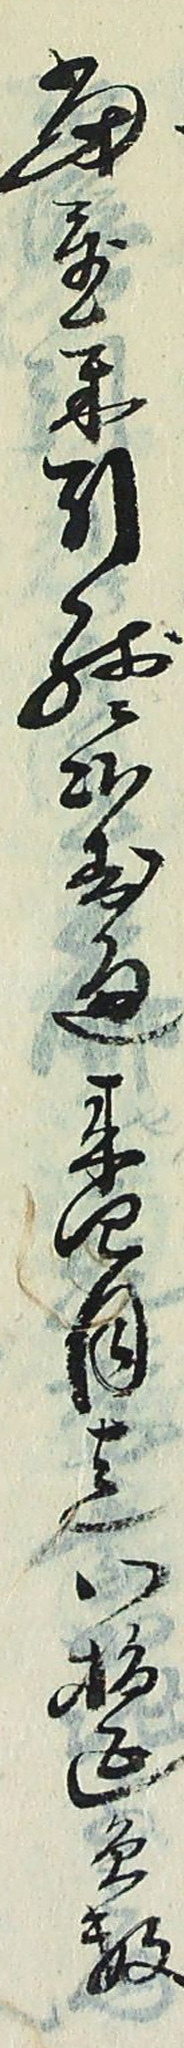當置米引残ニ弐歩通来四月迄御指延員数
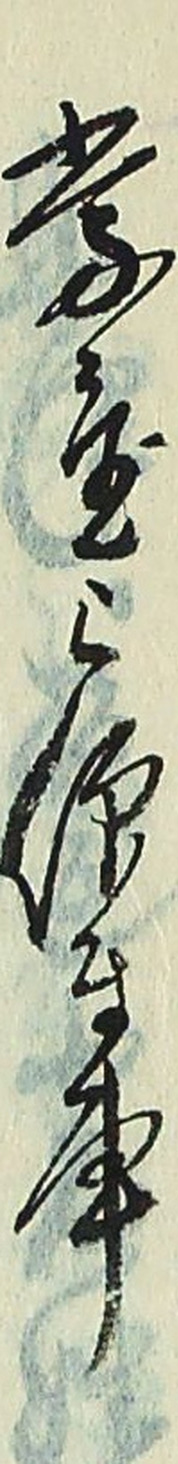當置被仰付事
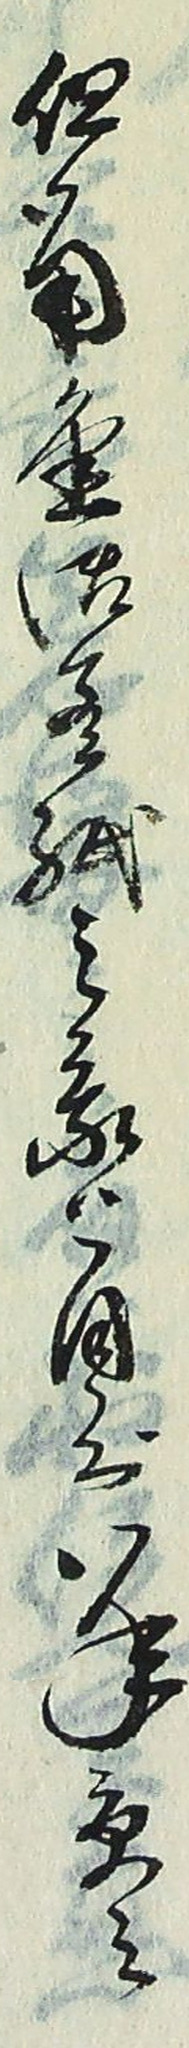但御用金御差紙之義ハ自分御年貢之
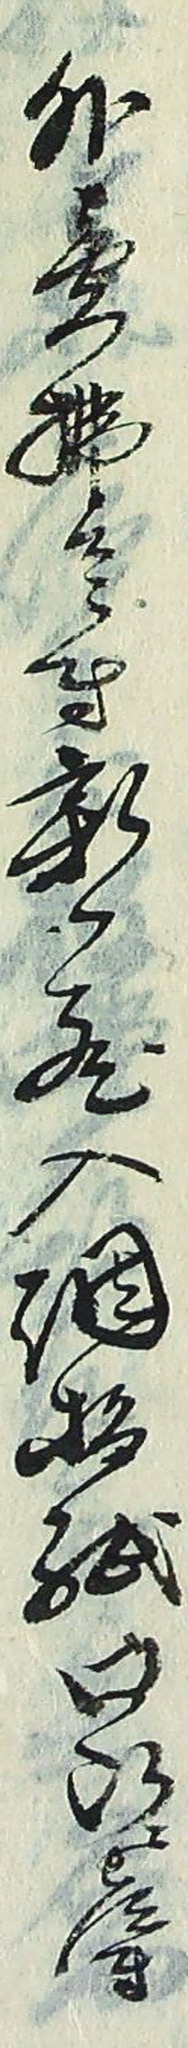外賣拂候ニ付新御蔵入調指紙同断ニ被仰付
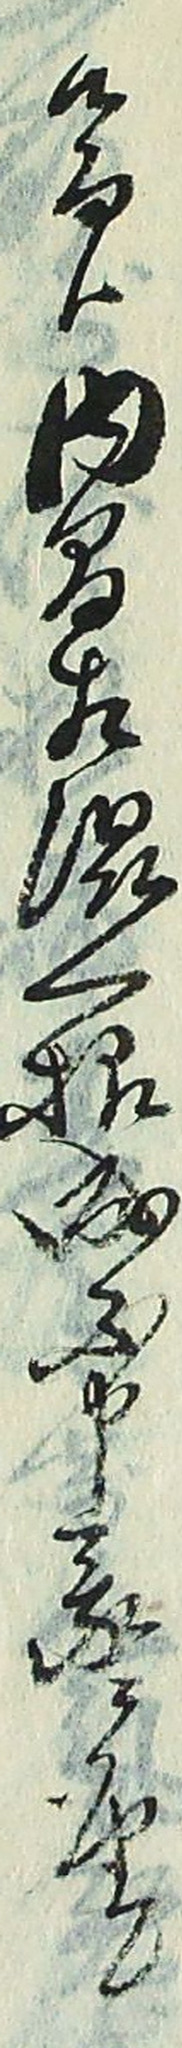候而ハ内間相混一様成不申義ニ御坐候
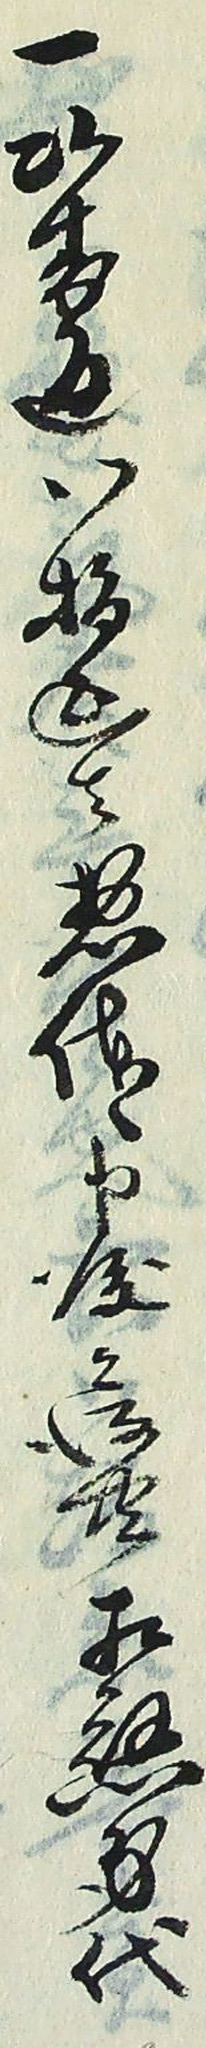一弐歩通御指延者惣体へ申渡候得共相應身代
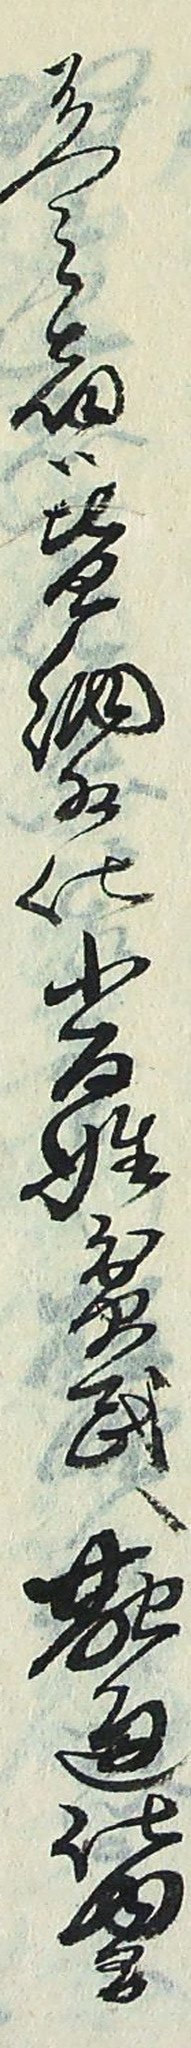有之者ハ皆納為仕小百姓貧民へ融通仕内間
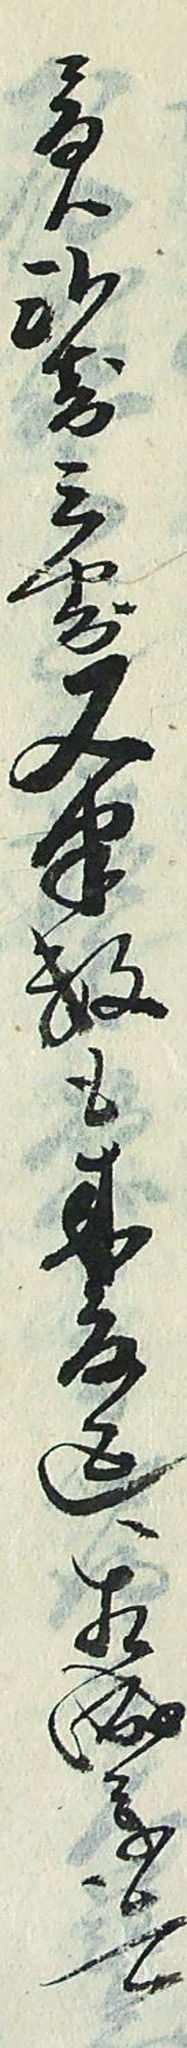ニ而ハ弐歩三歩又半数も来夏延へ相成義も可
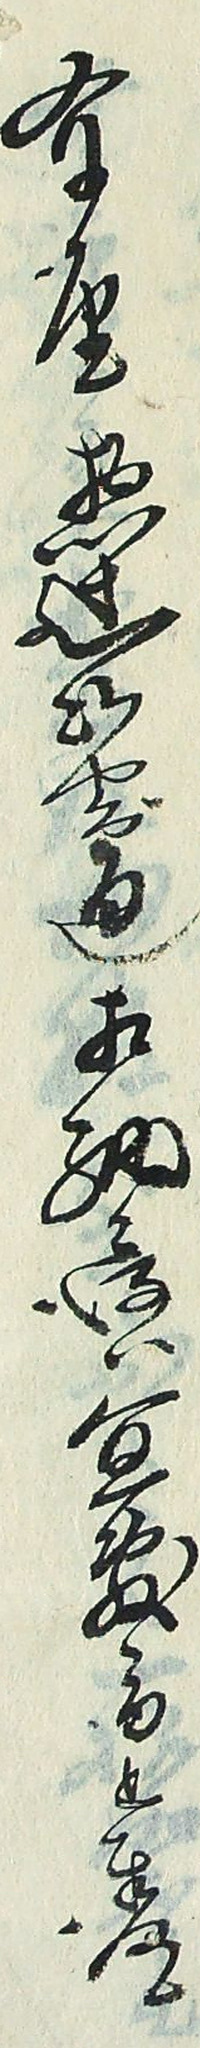有御坐候惣辻弐歩通相納候得ハ宜敷旨と奉存候

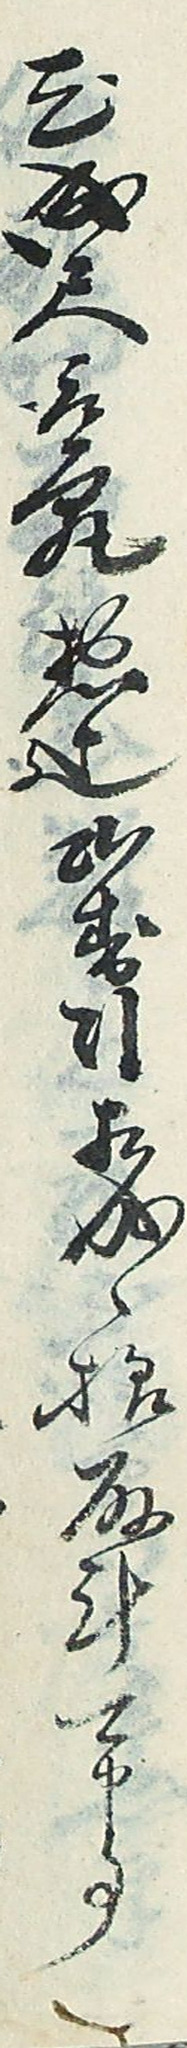尤成丈取究惣辻弐歩引相成候様取計可申事
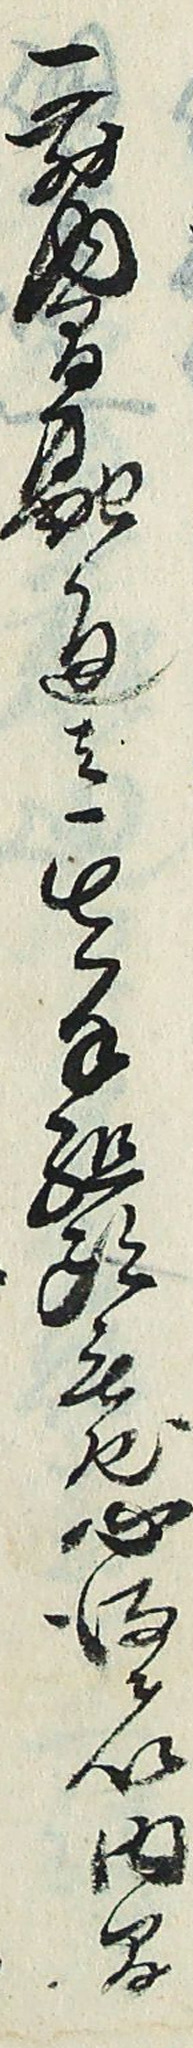一前内間融通者其手組頭庄屋心得ヲ以内間
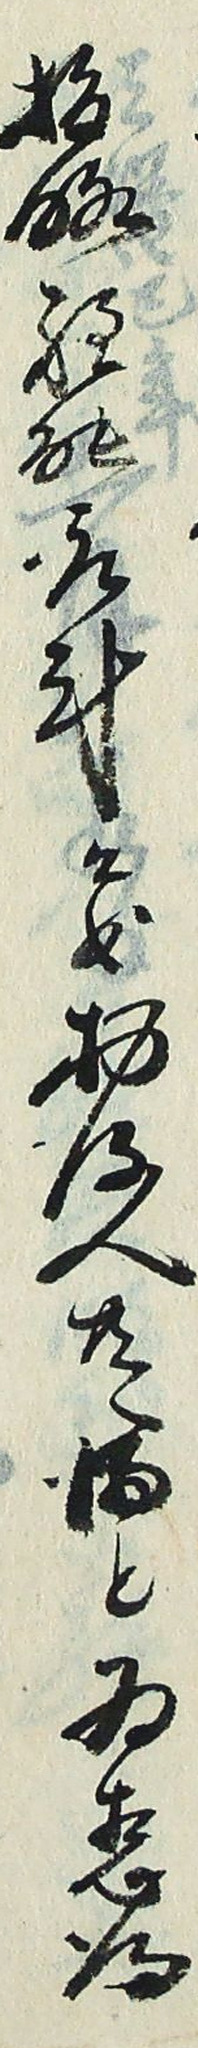指略程能取計候義村役人共へ得と為相心得
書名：諸御趣意書并御下知向之写
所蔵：鳴門教育大学 Naruto University of Education
